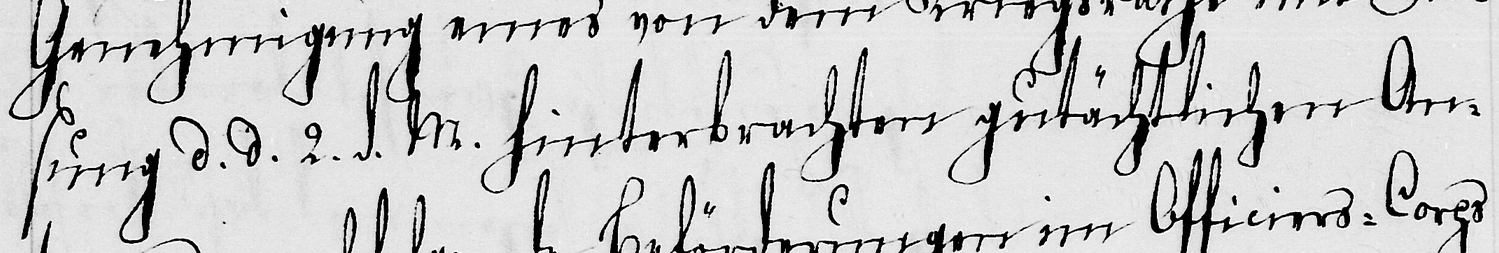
sung d. d. 2. d. M. hinterbrachten gutächtlichen An¬
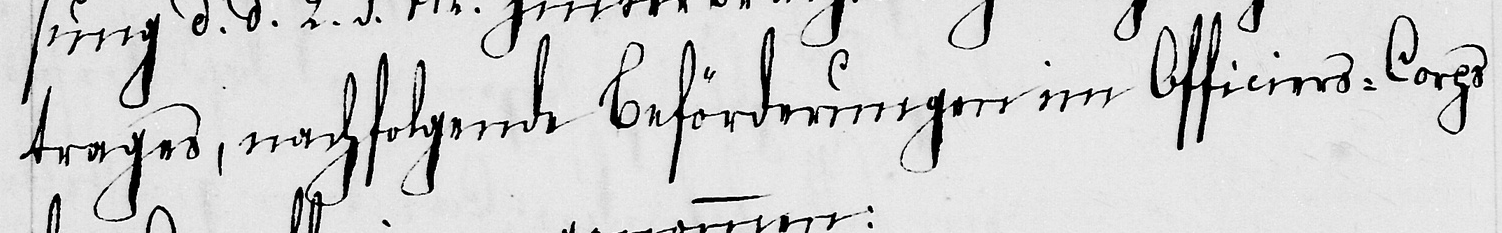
trages, nachfolgende Beförderungen im Officiers-Corps
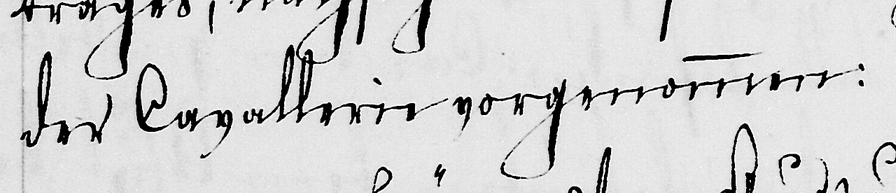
der Cavallerie vorgenommen:
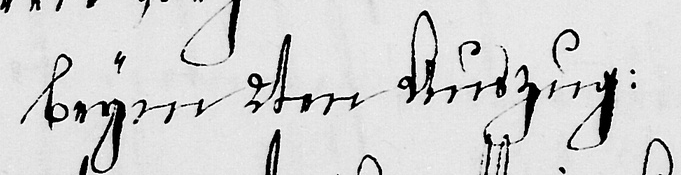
Beym 2ten Auszug:
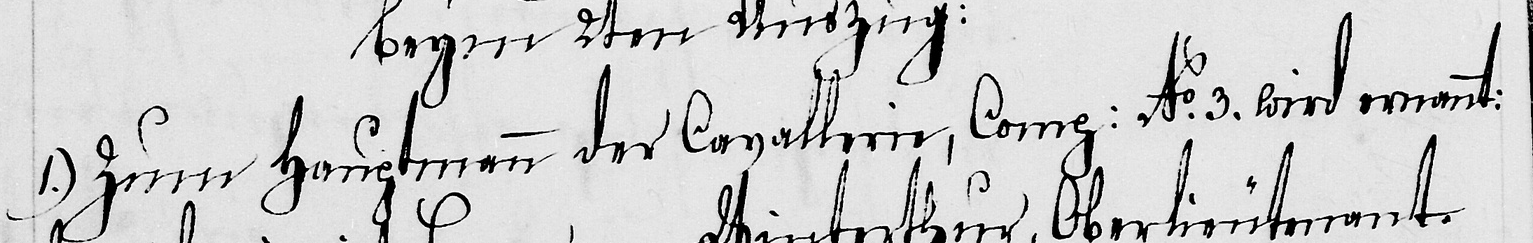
1.) Zum Hauptmann der Cavallerie, Comp: No. 3. wird ernan¬
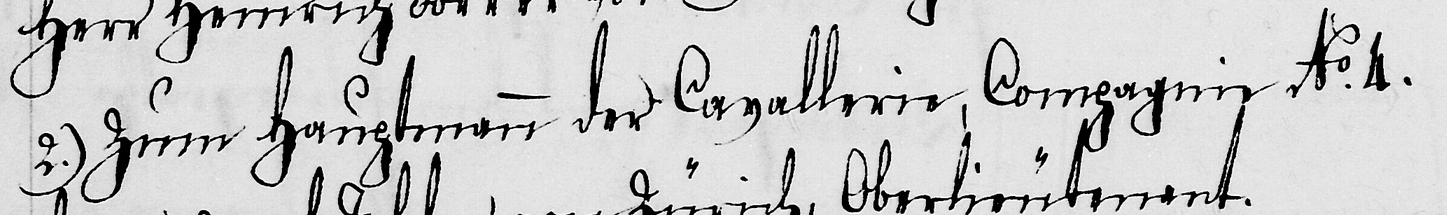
2.) Zum Hauptmann der Cavallerie, Compagnie No. 4.
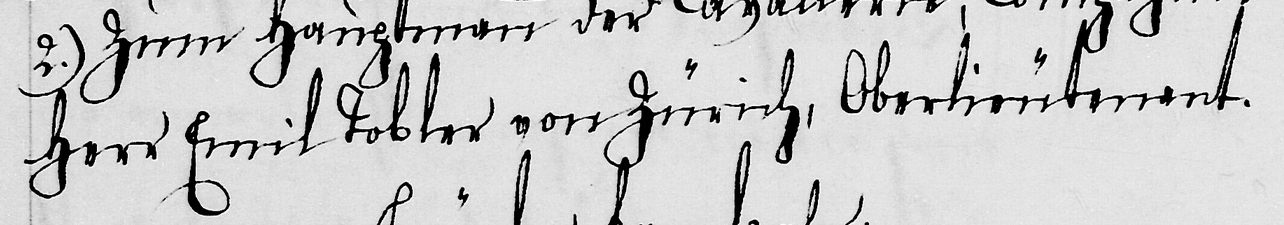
Herr Emil Tobler von Zürich, Oberlieutenant.
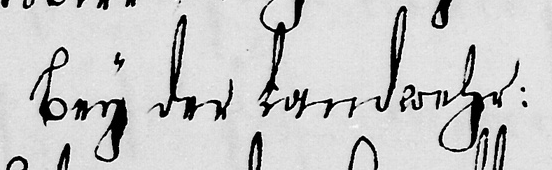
Bey der Landwehr:
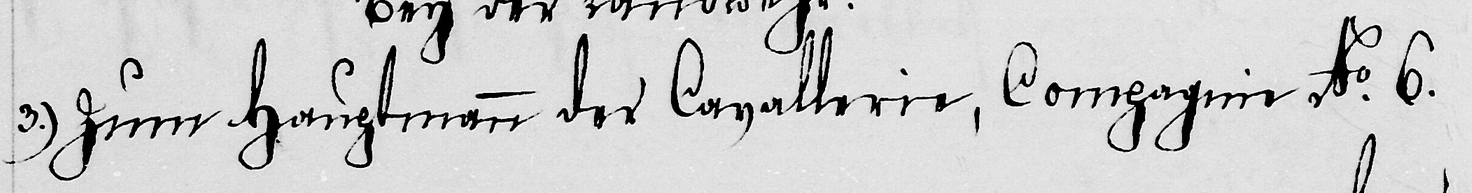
3.) Zum Hauptmann der Cavallerie, Compagnie No. 6.
